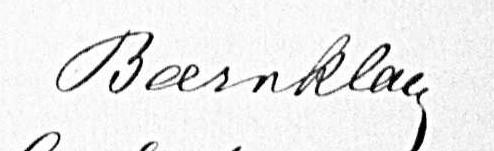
Barnklaxx
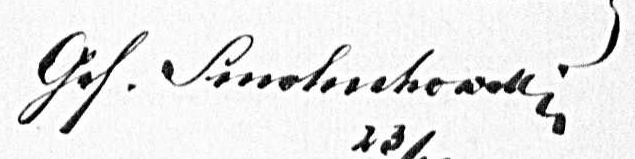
Ges. Smolnchowski
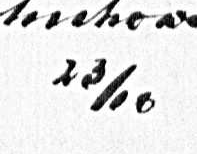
23/10
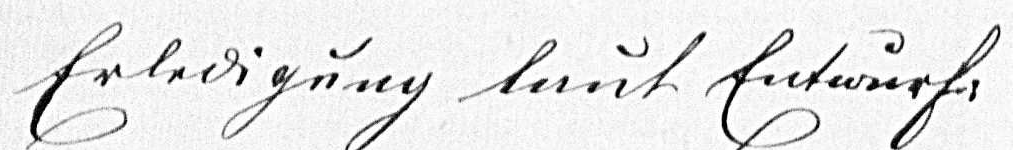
Erledigung laut Entwurf:
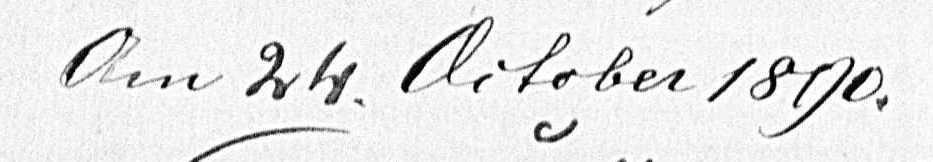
Am 24. October 1890.
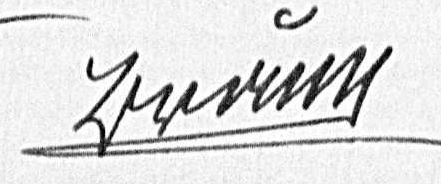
Braun
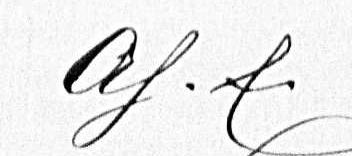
Ah. E.
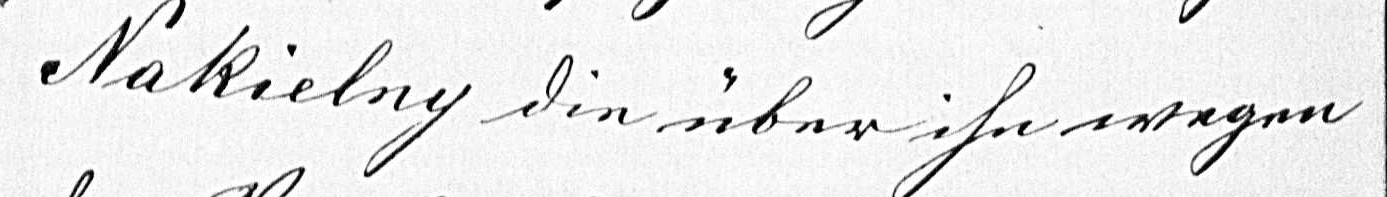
Nakielny die über ihn wegen
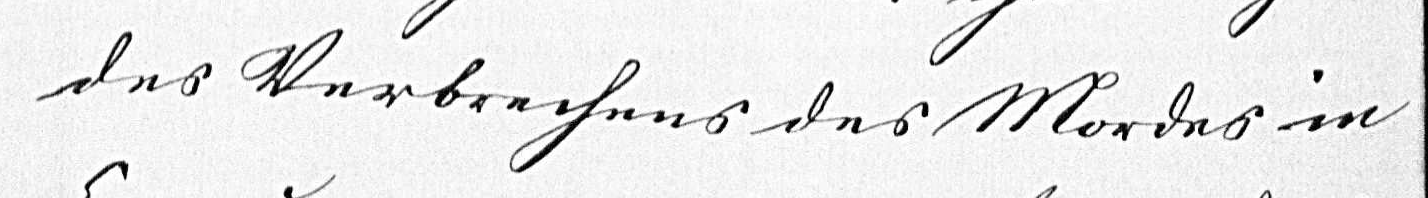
des Verbrechens des Mordes in
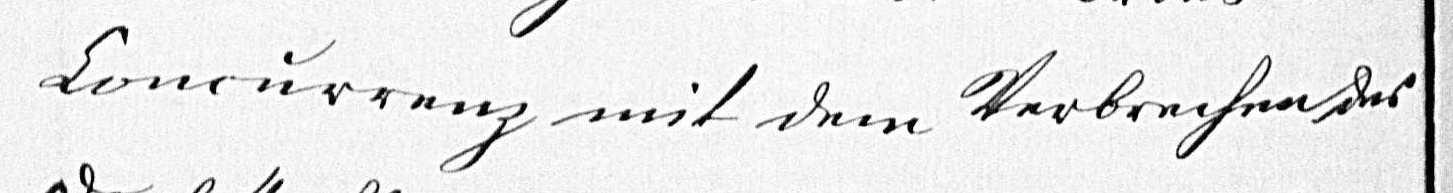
Concurrenz mit dem Verbrechen des
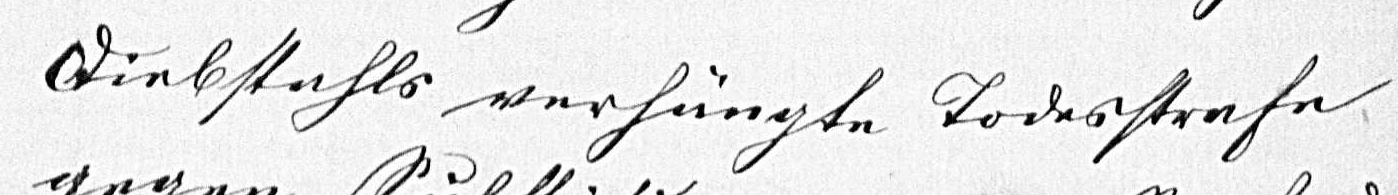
Diebstahls verhängte Todesstrafe
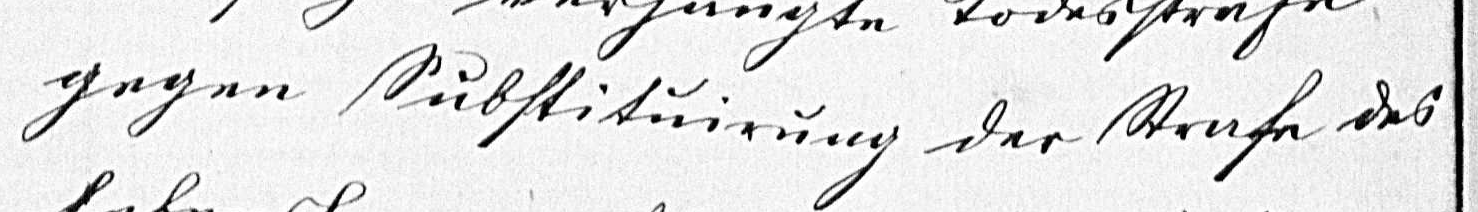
gegen Substituirung der Strafe des
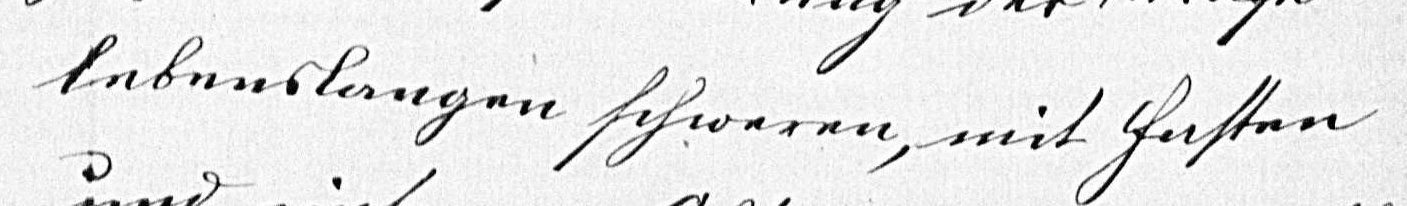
lebenslangen schweren, mit Fasten
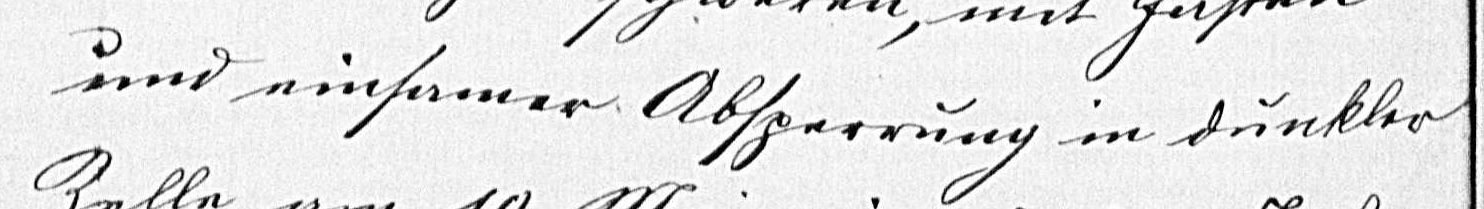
und einsamer Absperrung in dunkler
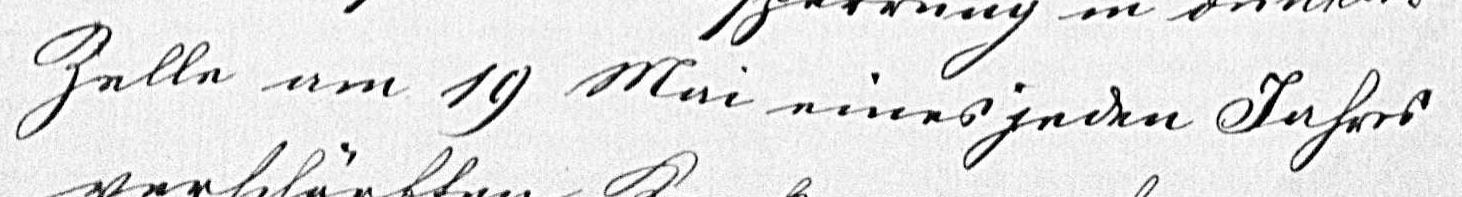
Zelle am 19 Mai eines jeden Jahres
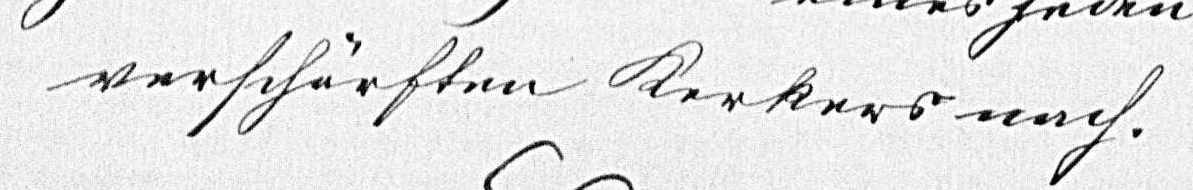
verschürften Kerkers nach.
